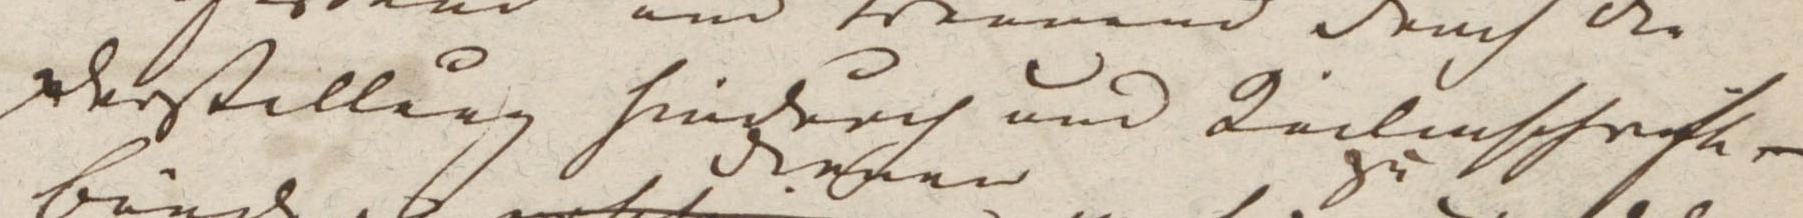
%Darstellung hindurch und Keilinschrift-
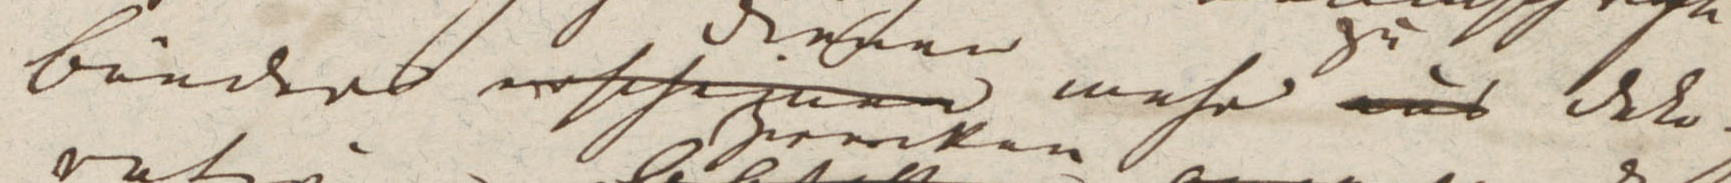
bänder erscheinen denen mehr aus zu deko-
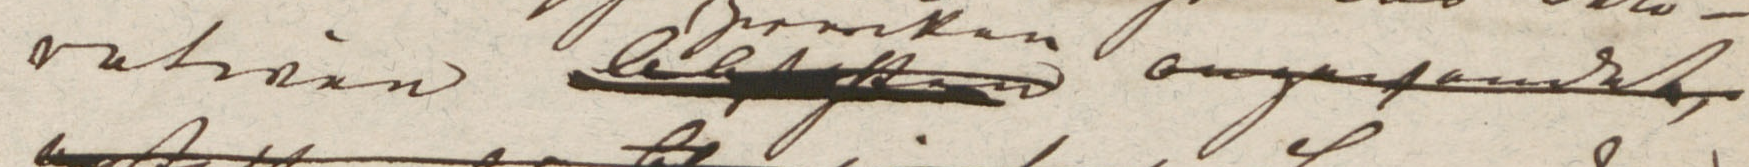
rativen Absichten Zwecken angewendet,
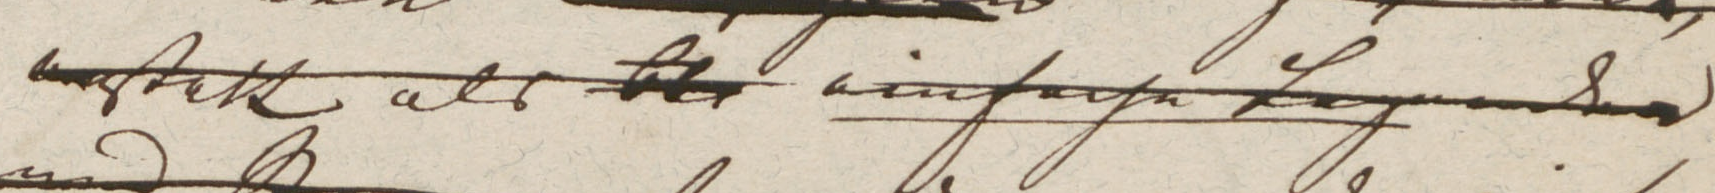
anstatt als einfache Legenden
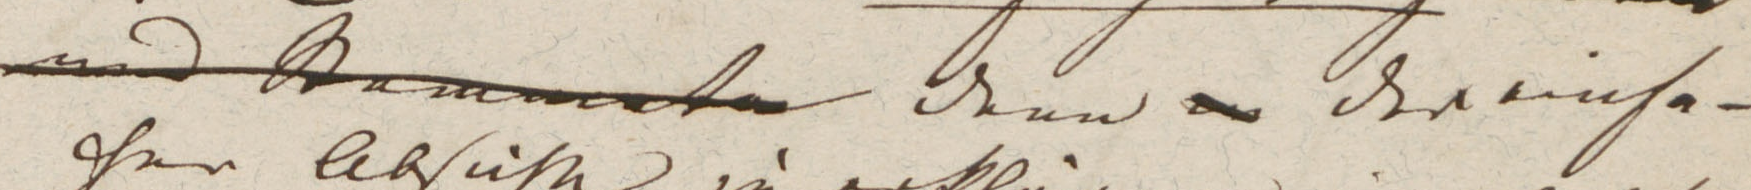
und Stemmata denn der einfa-
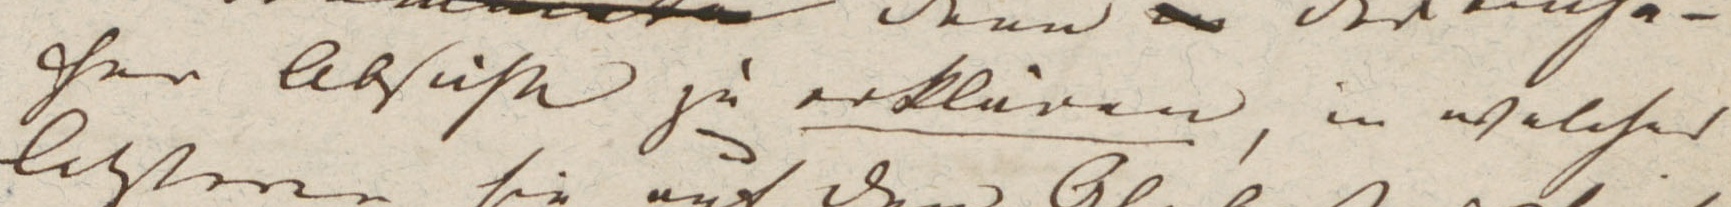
chen Absicht zu erklären, in welcher
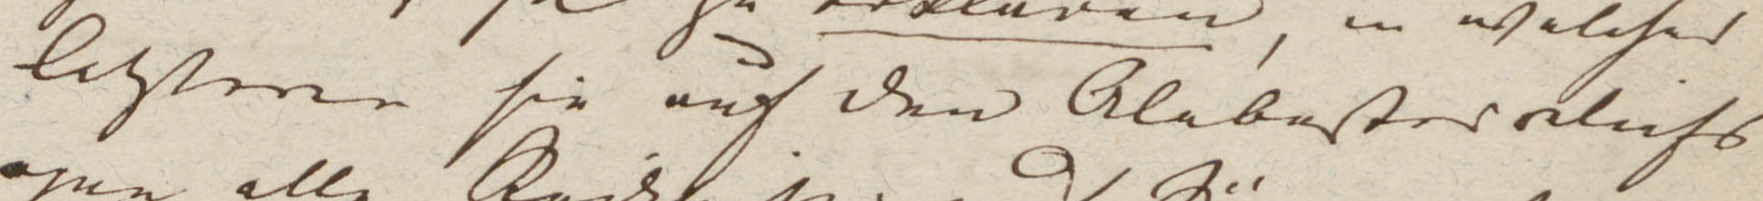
letzteren sie auf den Alabasterreliefs
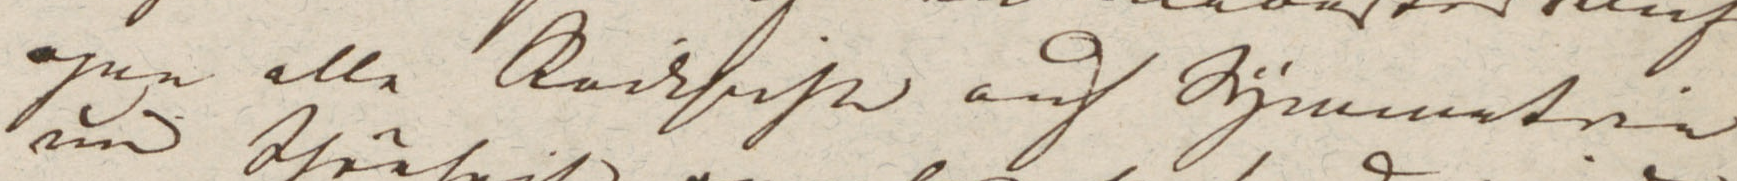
ohne alle Rücksicht auf Symmetrie
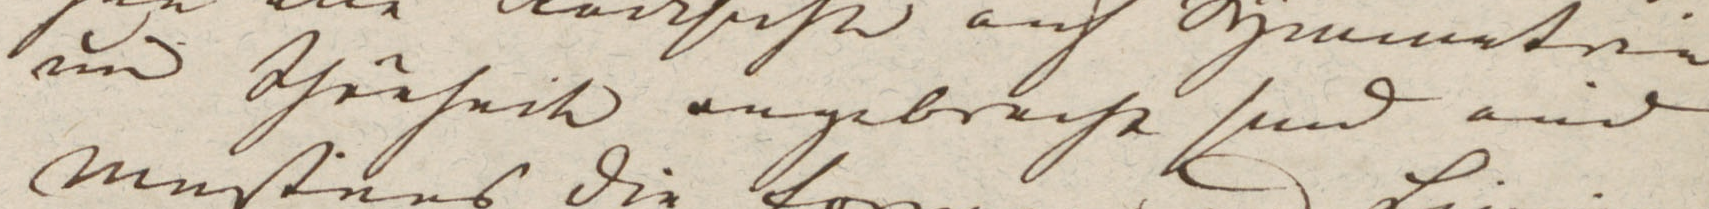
und Schönheit angebracht sind und
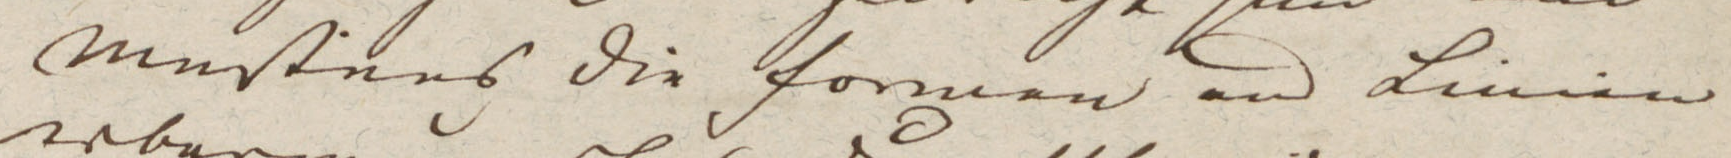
meistens die Formen und Linien
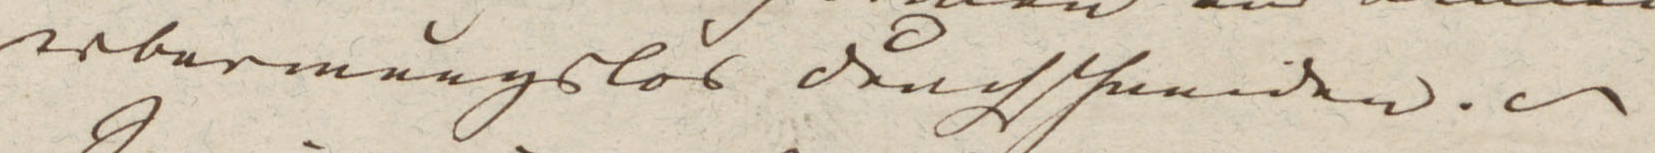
erbarmungslos durchschneiden. –
